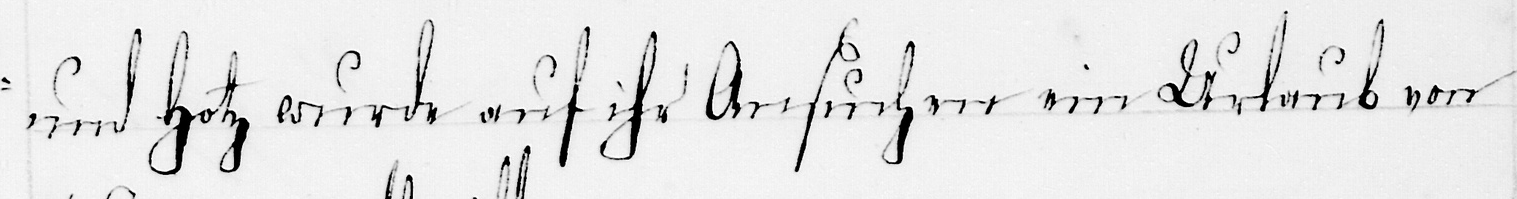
und Hotz wurde auf ihr Ansuchen ein Urlaub von
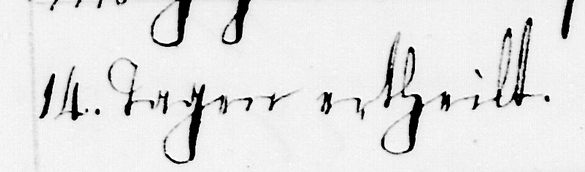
14. Tagen ertheilt.
